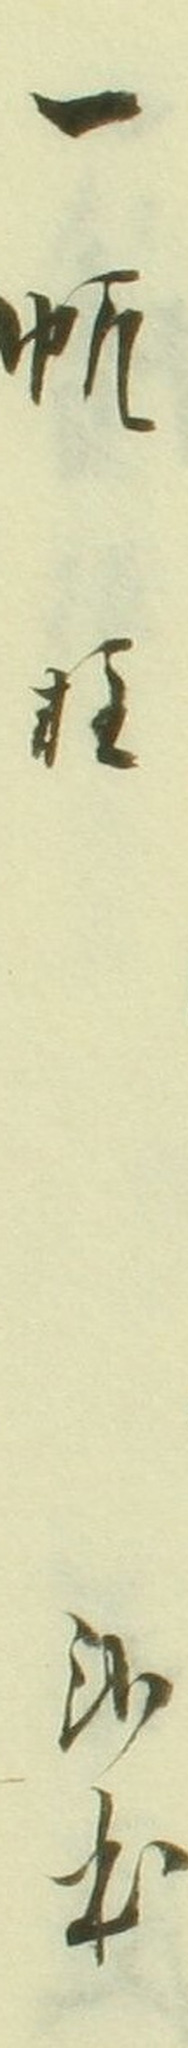一帆柱弐本
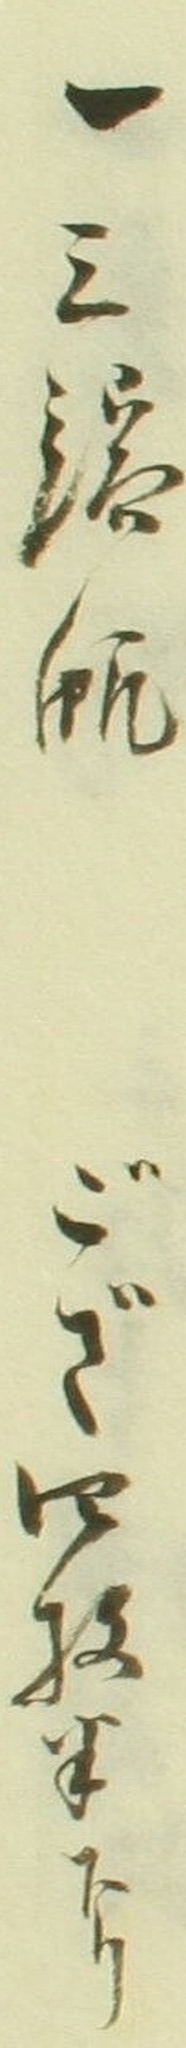一三端帆ござ四枚半下り
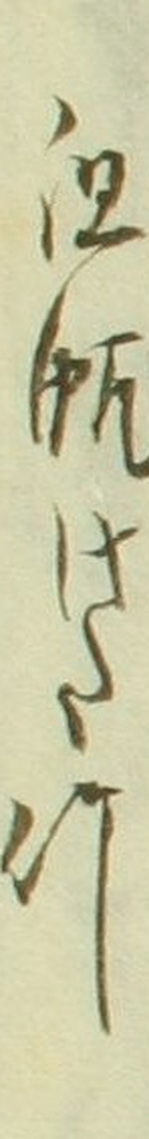但帆けた竹
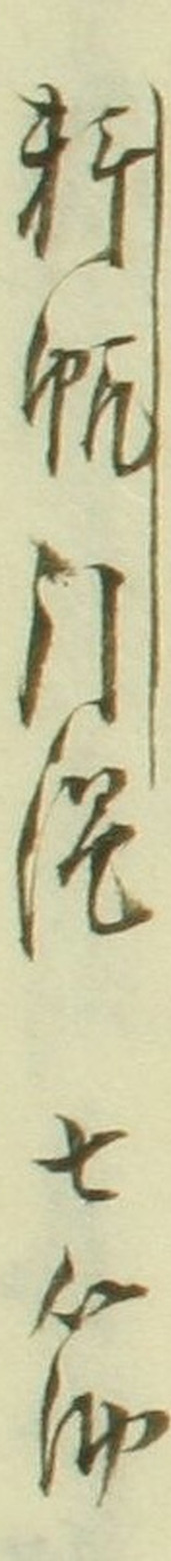料帆引縄七筋
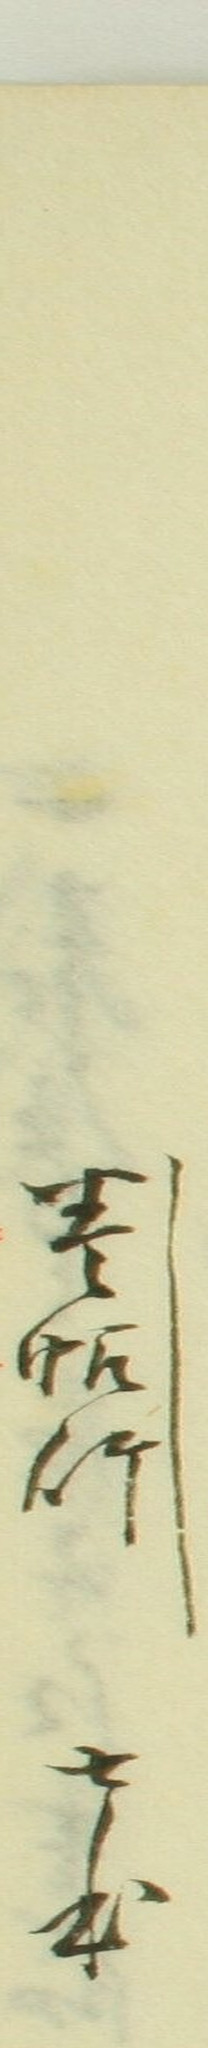巻帆竹七本
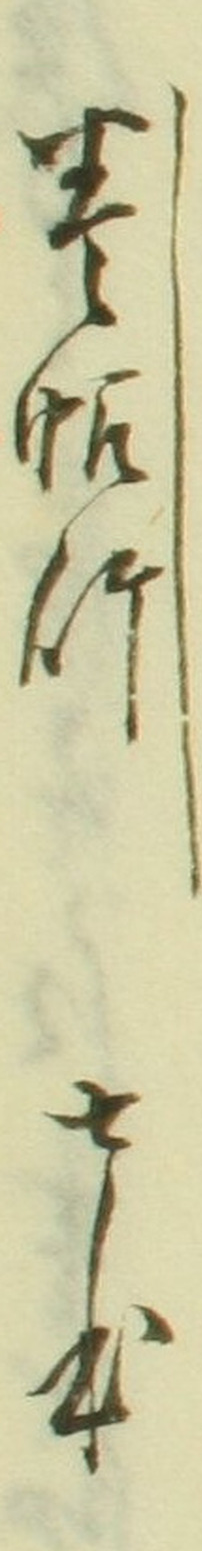巻帆竹七本

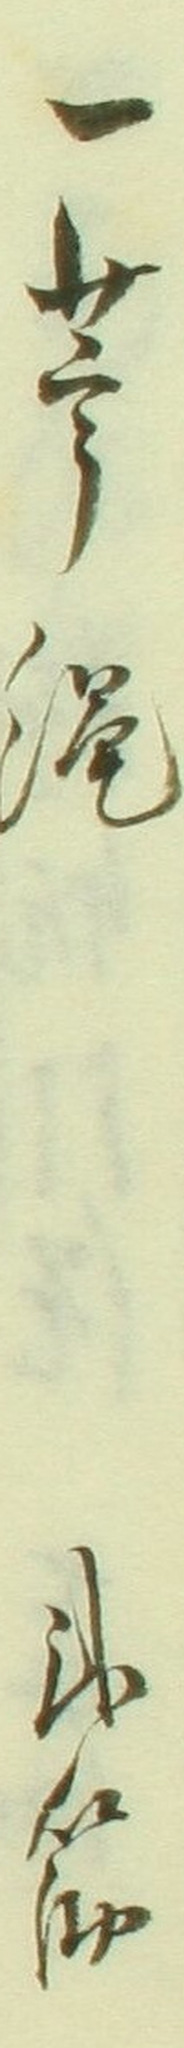一苧縄弐筋
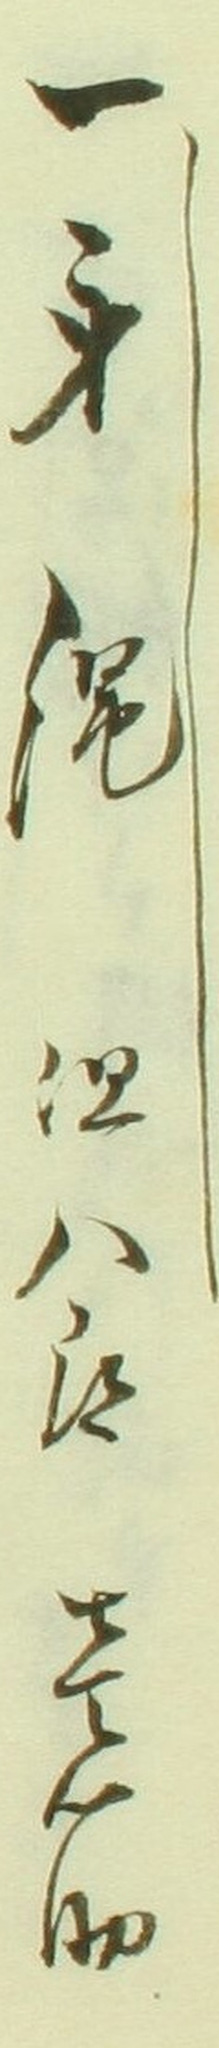一身縄但八尋壱筋
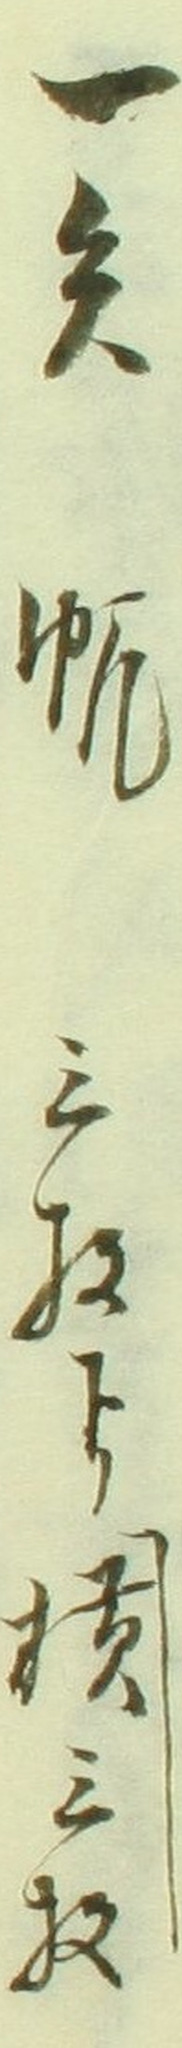一矢帆三枚下り横三枚
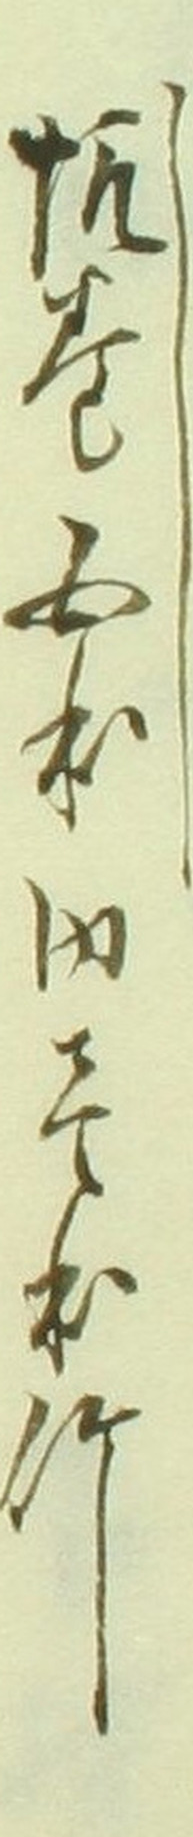帆巻五本内壱本竹
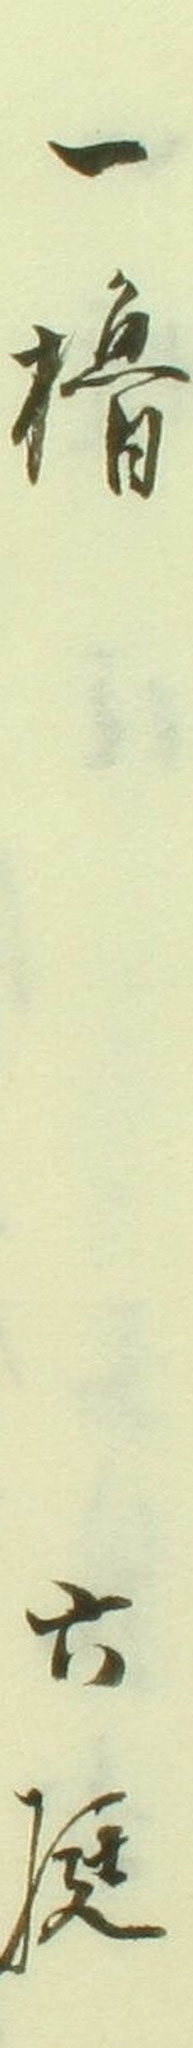一櫓六挺
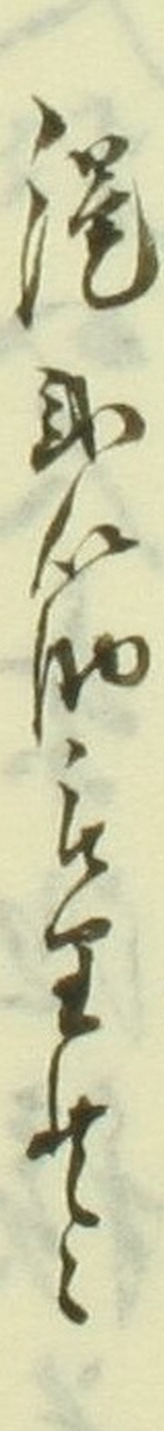縄弐筋もり無之
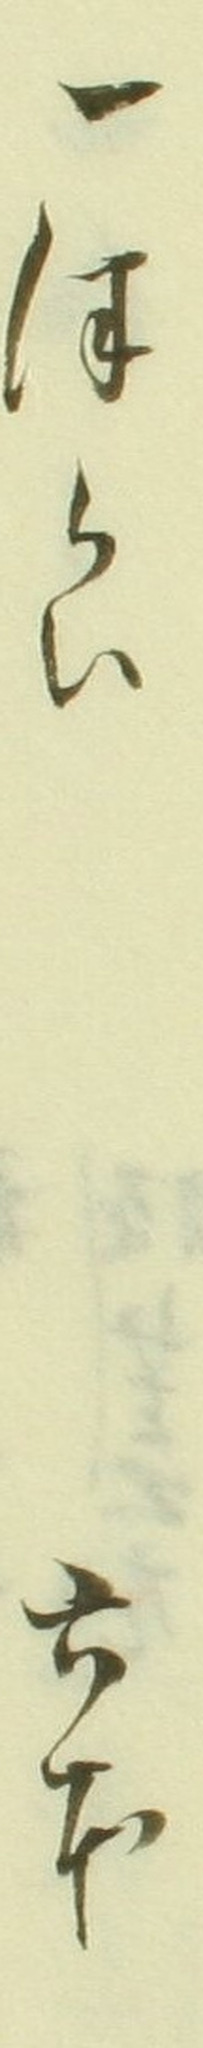一つかい六本
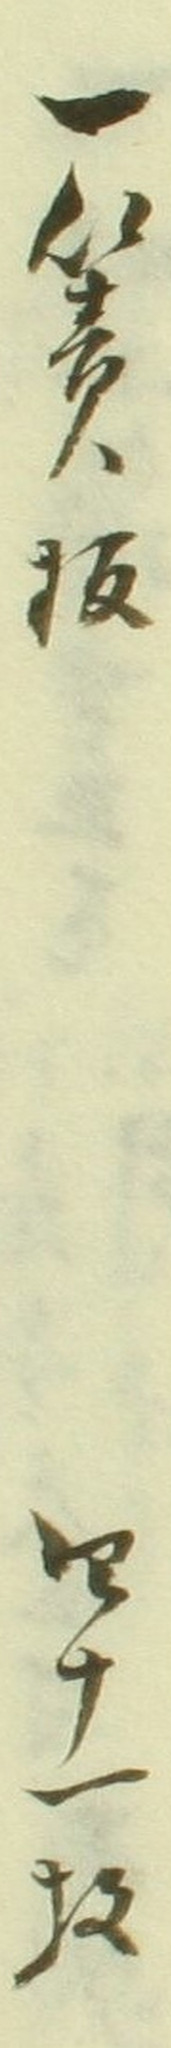一簀板四十一枚
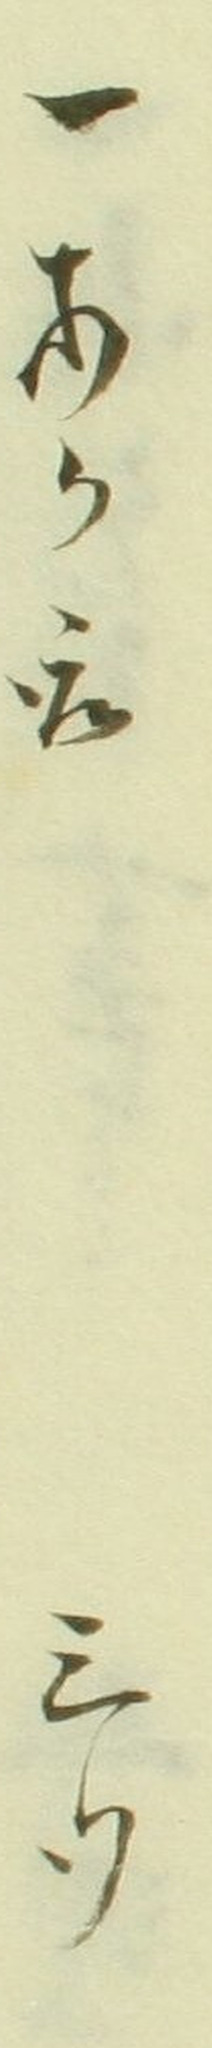一あか取三ツ
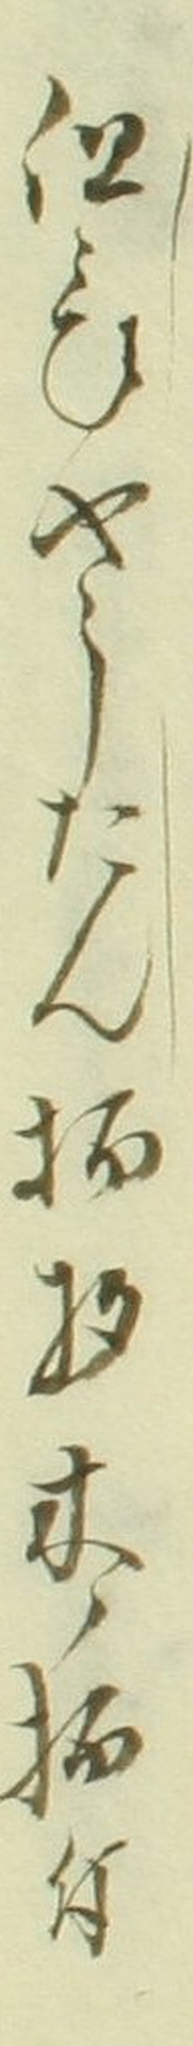但ひゃうたん柄杓木ノ柄付
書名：異国船漂着記
